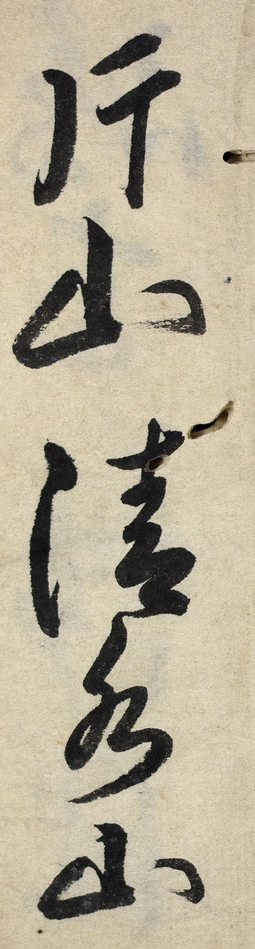片山清水山

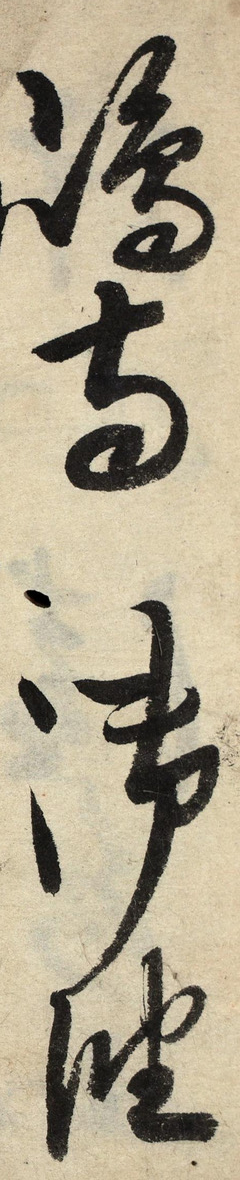嶋寺御油
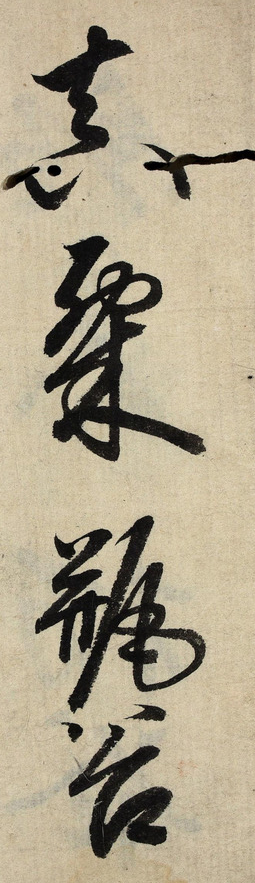真栗瓶谷
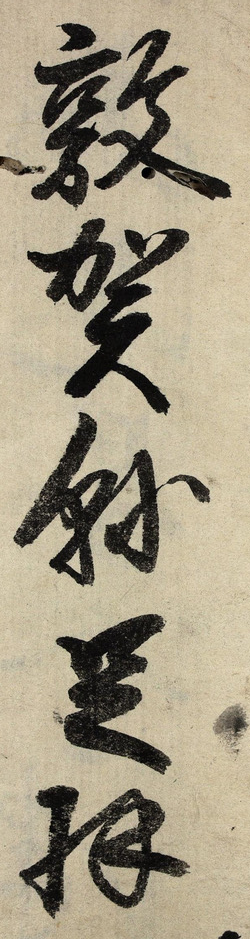敦賀縣足羽
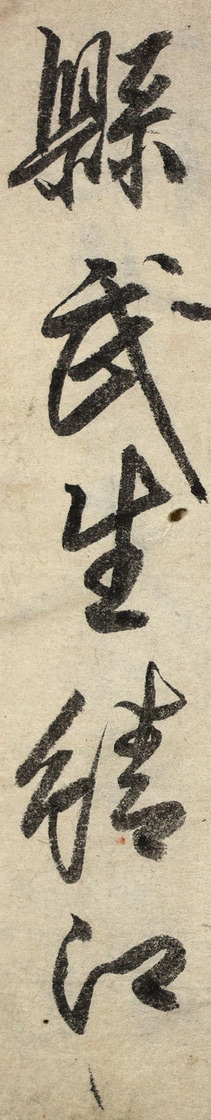縣武生鯖江

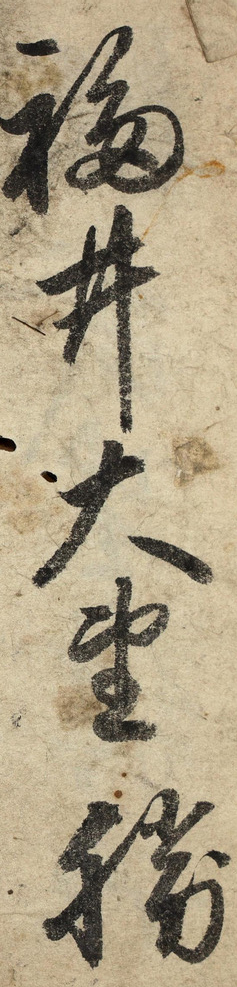福井大野勝
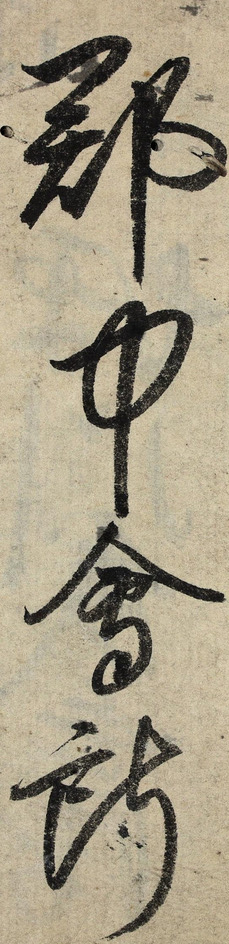郡中會所
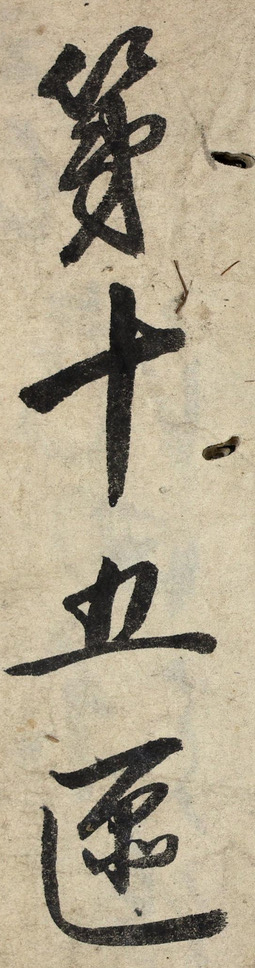第十五區

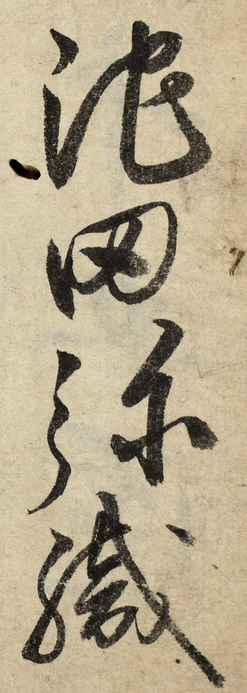池田弥織
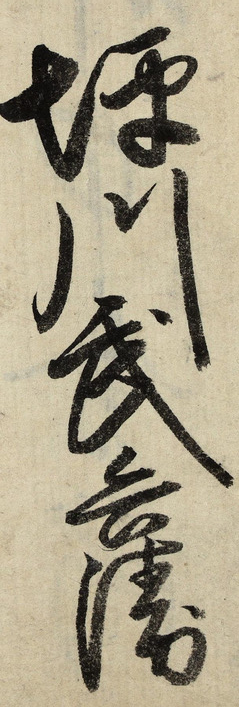坪川武兵衛
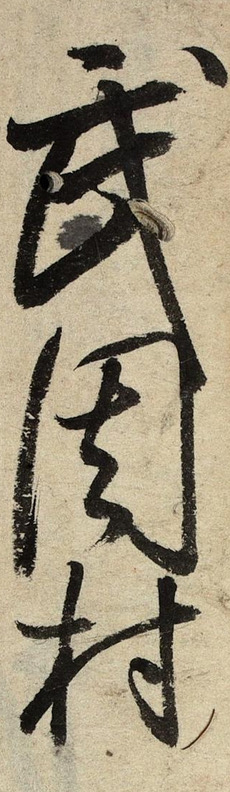武周村
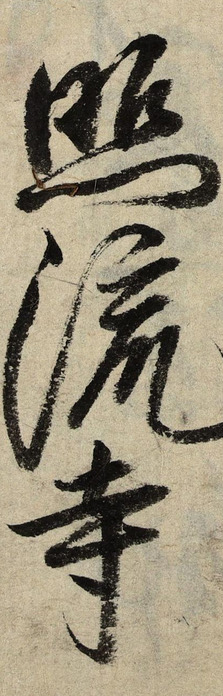照流寺
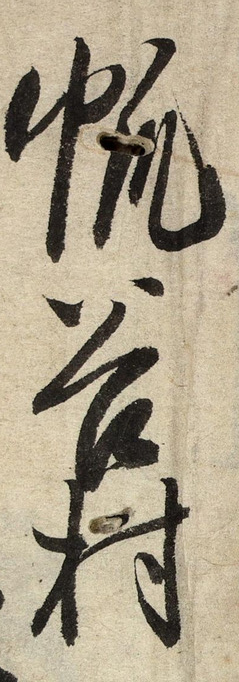帆谷村
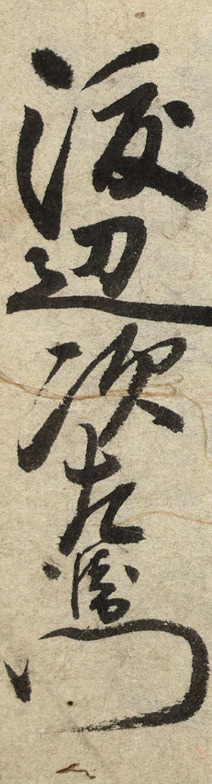渡辺次左衛門

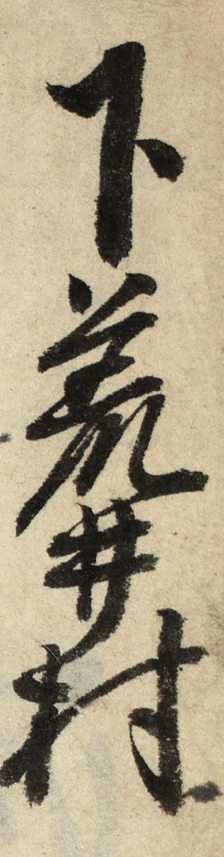下荒井村
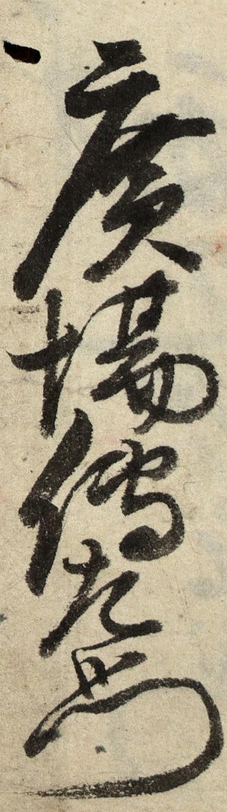廣場傳左衛門
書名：村尽（合谷・南居・三尾野等村々、敦賀県・足羽県等、受取等例文…
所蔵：福井県文書館 Fukui Prefectural Archives
